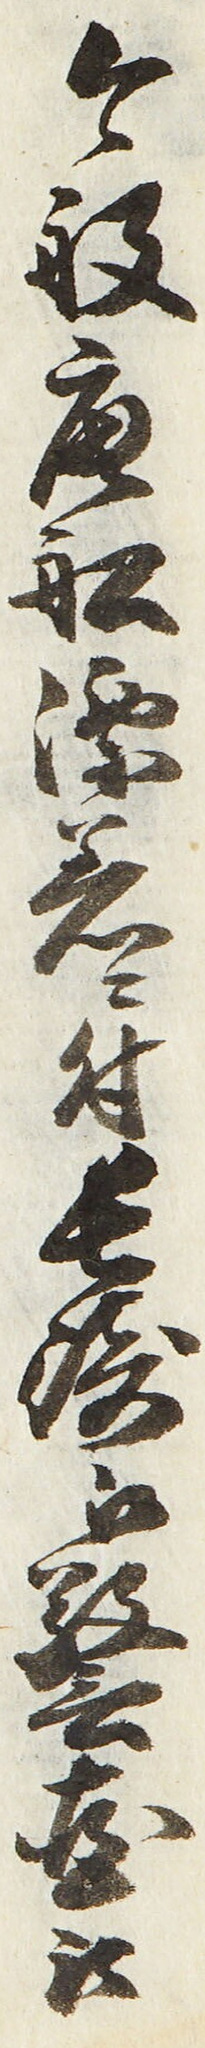今般唐船漂着ニ付長崎江警固被
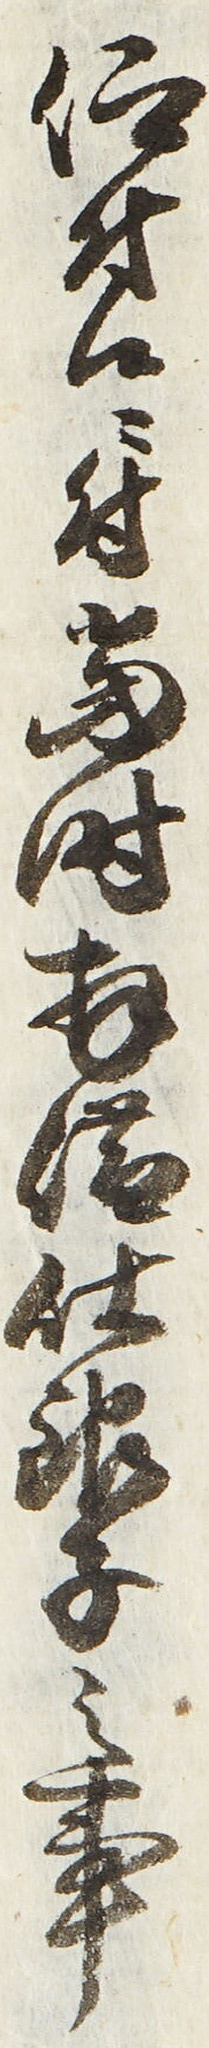仰付候ニ付当時拝借仕銀子之事
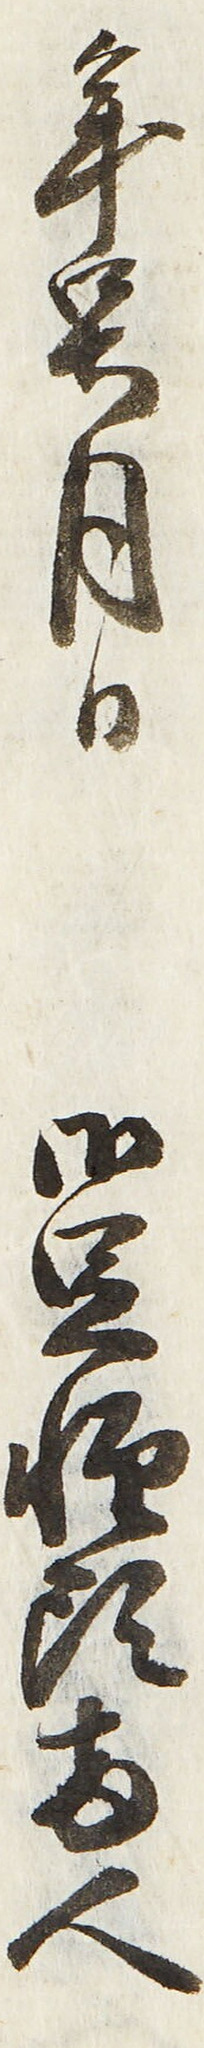年号月日御足軽頭両人
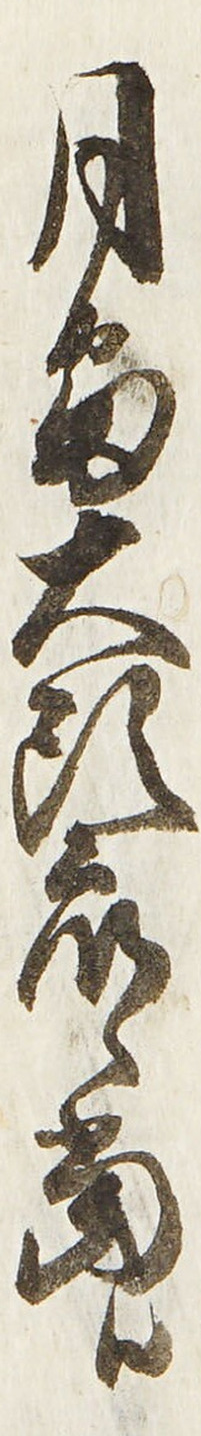月番大頭衆へ当ル
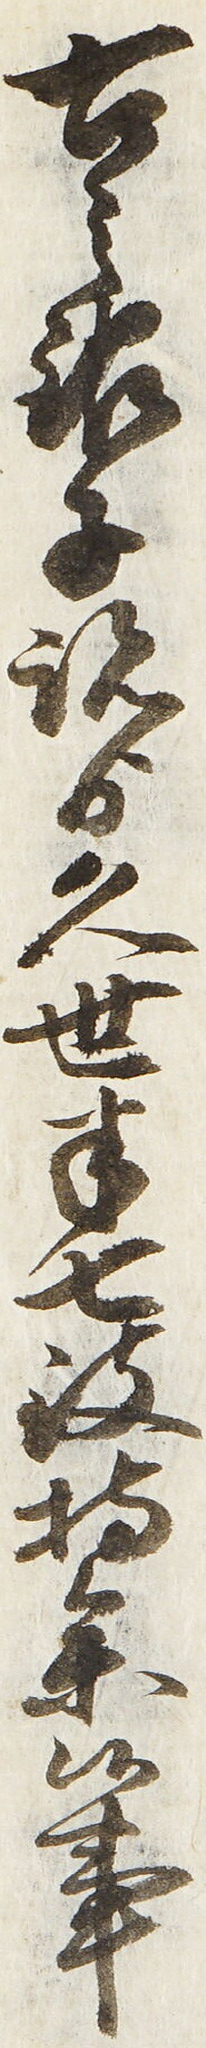右之銀子跡ゟ久世半七致持参候事
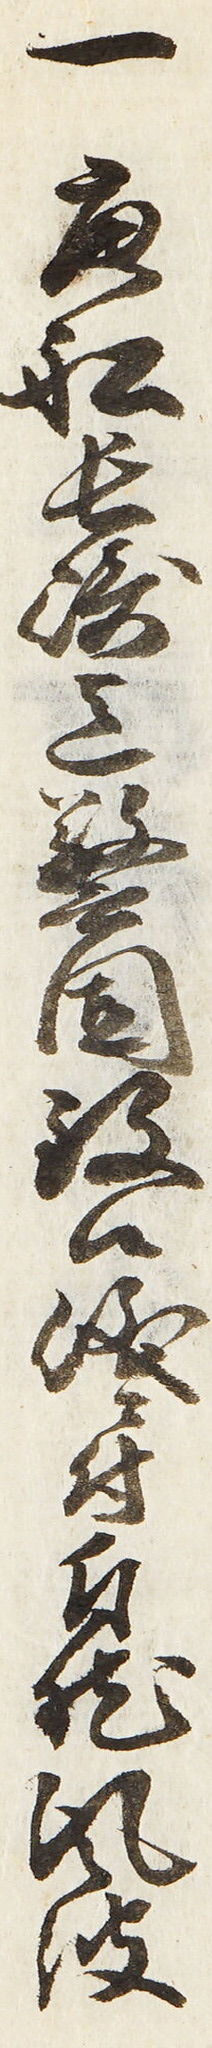一唐船長崎迄警固致候儀ニ付自然風波
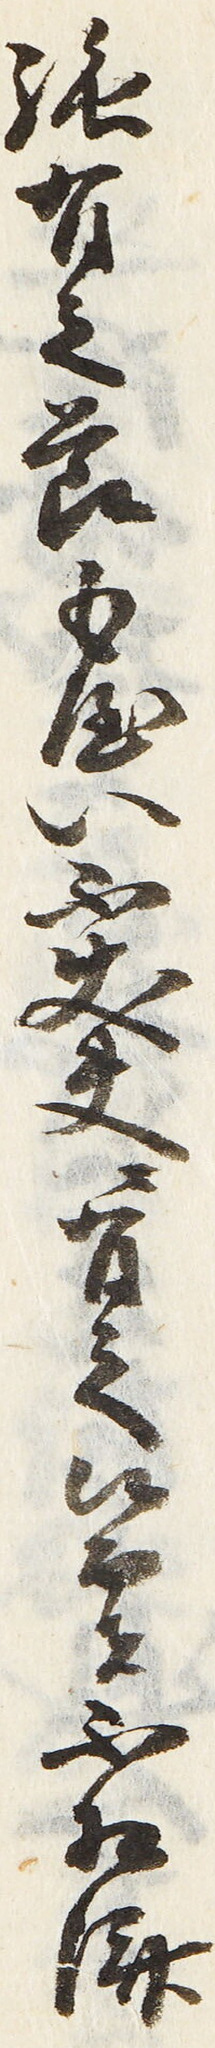強有之節もやい不丈夫ニ有之候而者不相済
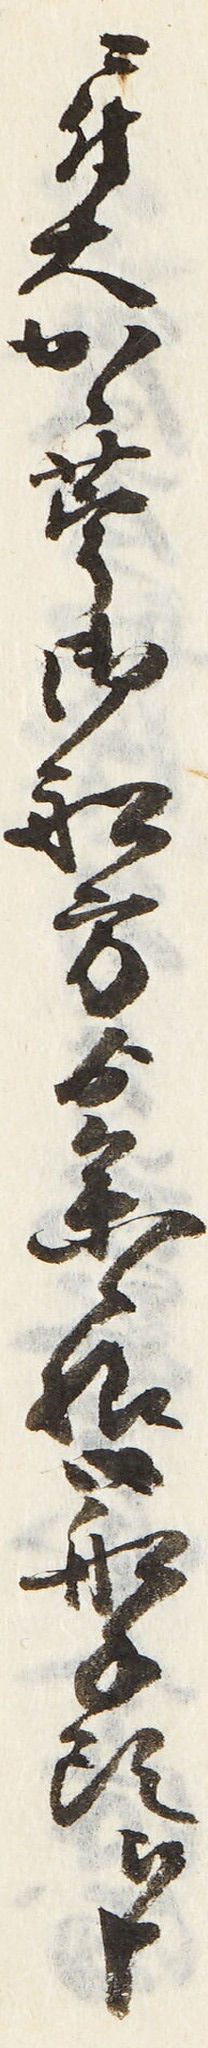ニ付大かゝ苧御船方ゟ参候様御船手頭江申
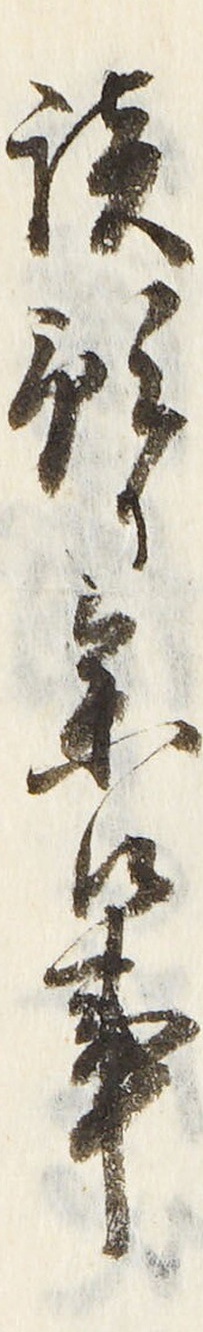談預り参候事
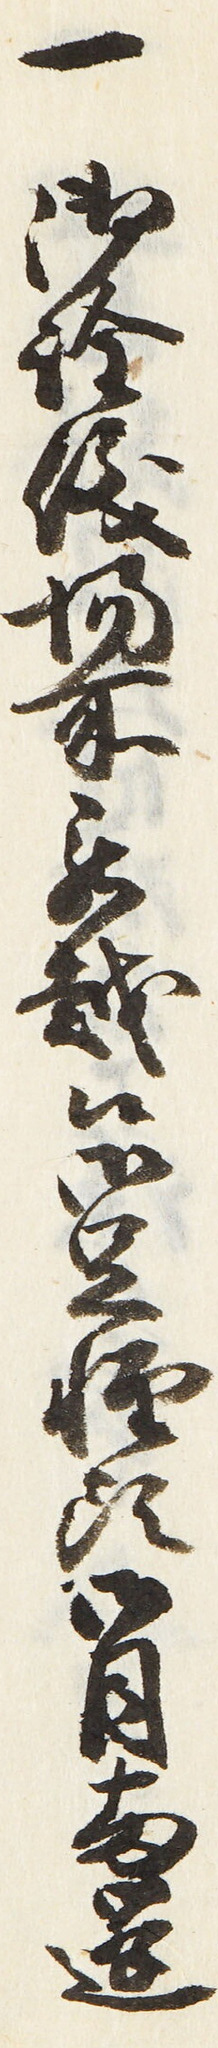一御詮儀場所罷越候御足軽頭御月番逢
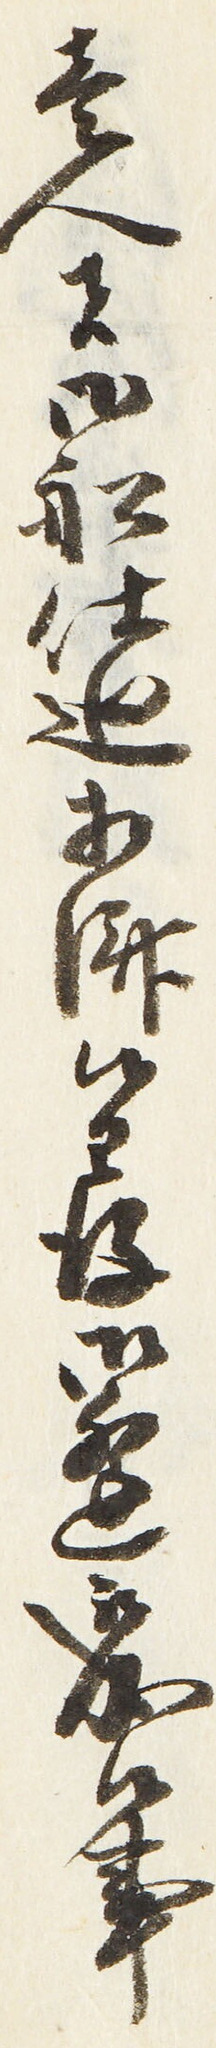壱人者御船仕廻相済候已後御逢被成候事
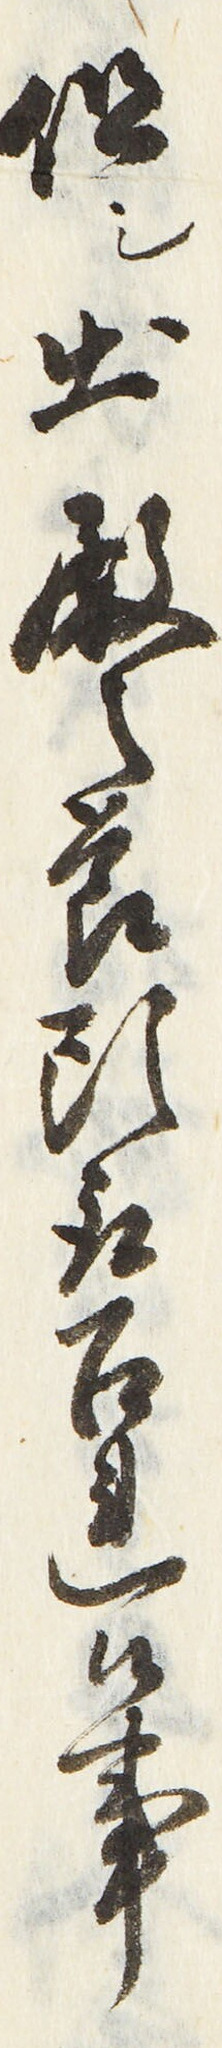但シ出殿之節頭取召連候事
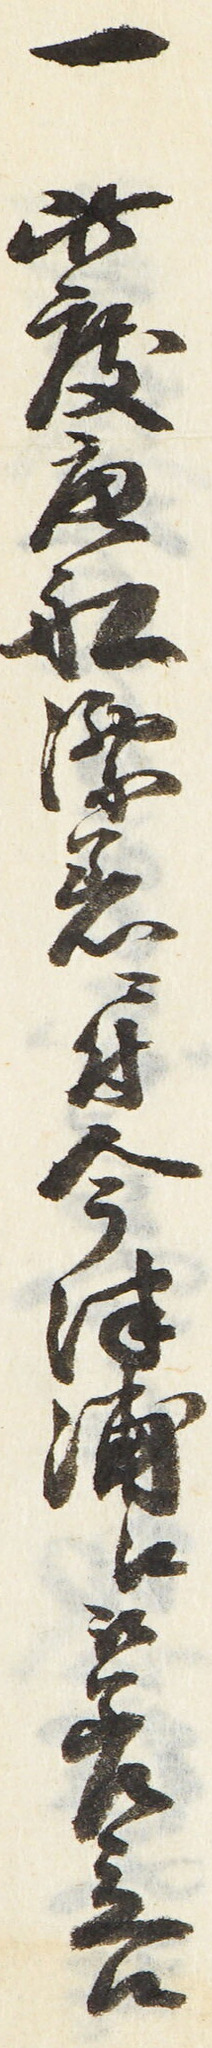一此度唐船漂着ニ付今津浦江被差立候

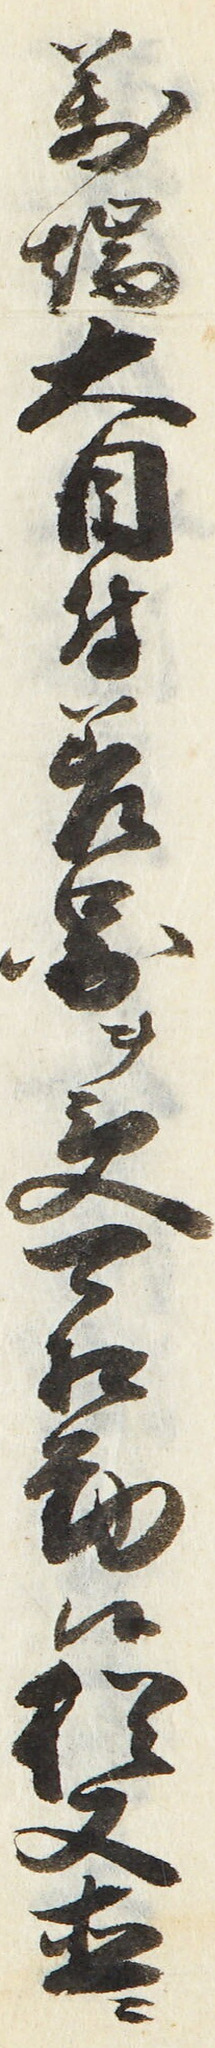万端大目付差図ヲ受可相勤候猶又直ニ
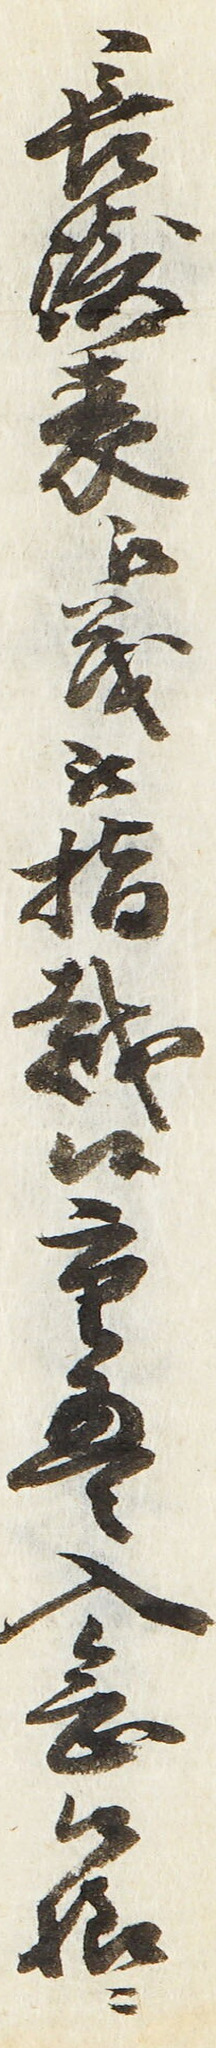長崎表江も被指越候重畳入念候様ニ
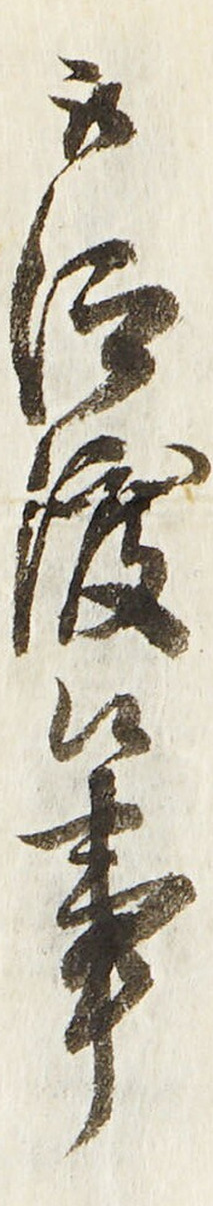被仰渡候事
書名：玄海嶋江漂着船為警固長崎江被越候覚
